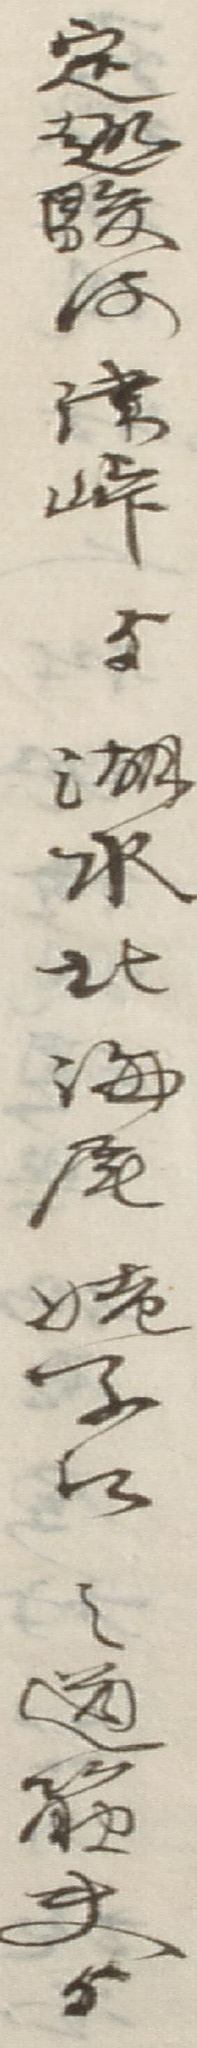定趣駿河潰峠ゟ湖水北海尾姥子え之道筋夫ゟ
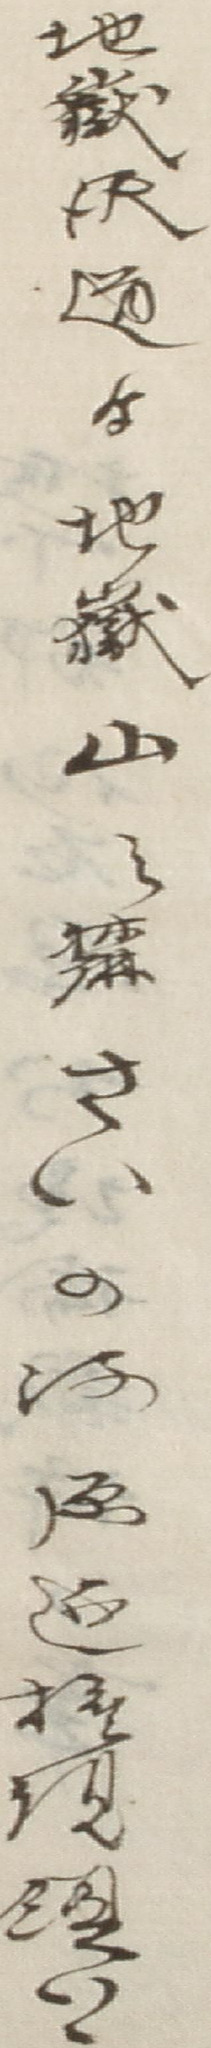地獄沢道ゟ地獄山之麓さいの河原迄権現領と
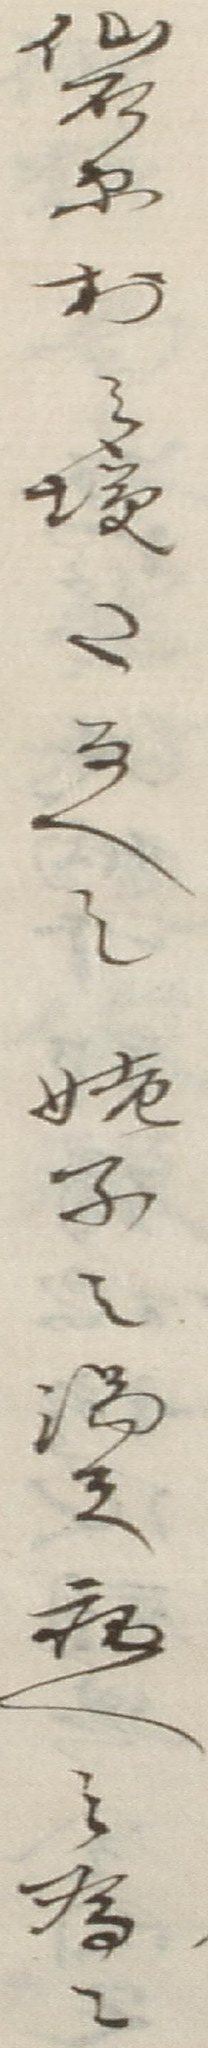仙石原村之境たるへし姥子之湯は病人之為ニ
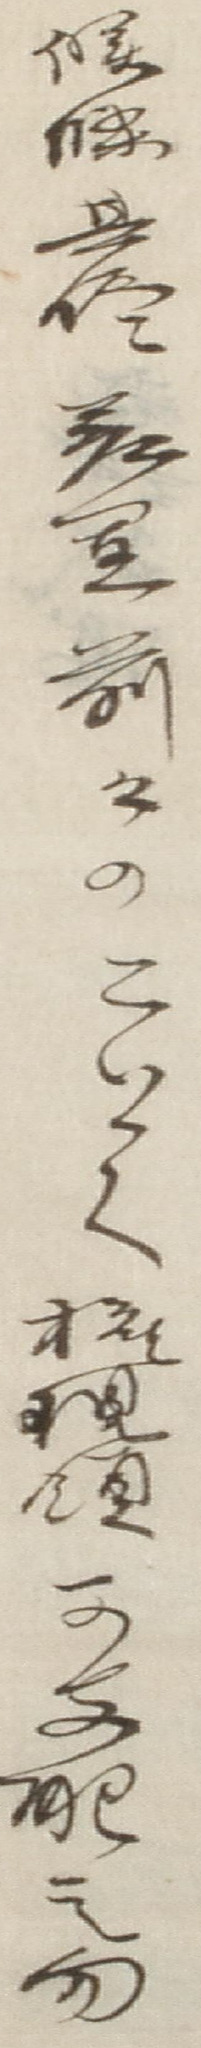候條其儘差宜前々のこと権現領可支配之勿
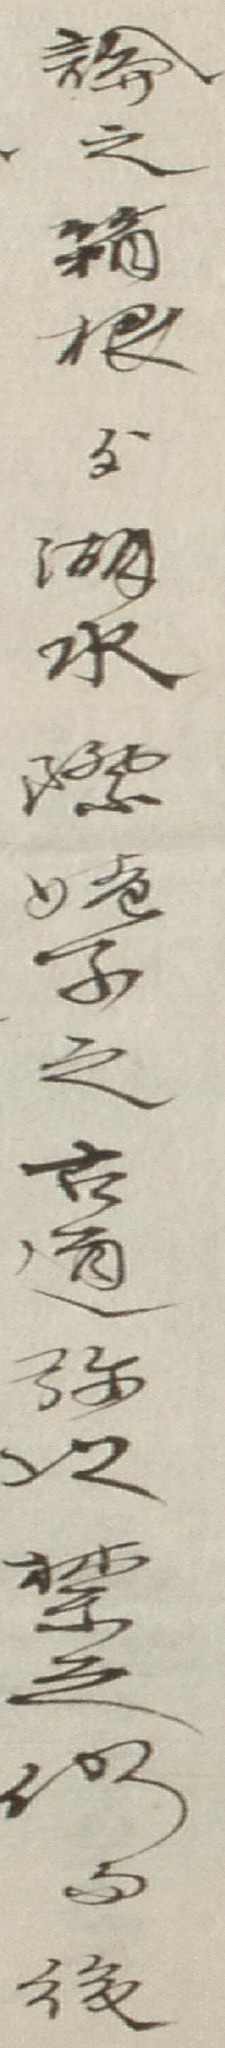論之箱根ゟ湖水際姥子之古道弥以禁之仍而後
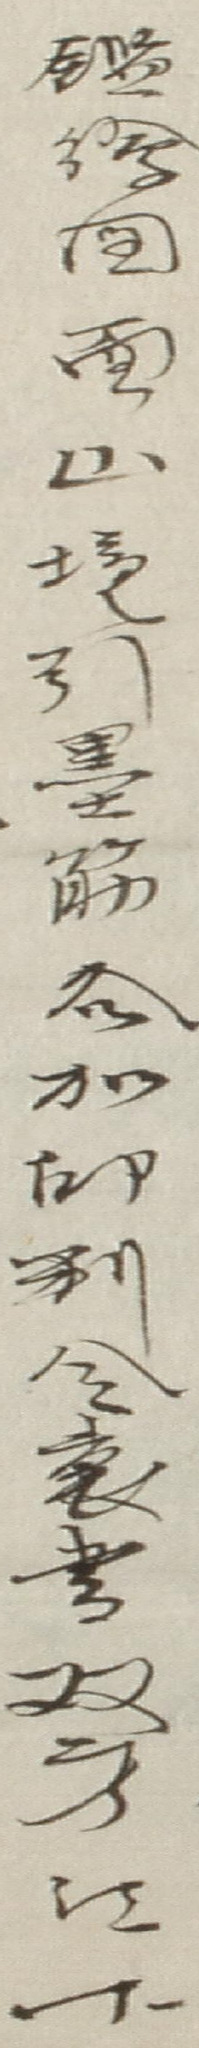鑑絵図面山境引墨筋合加印判合裏書双方え
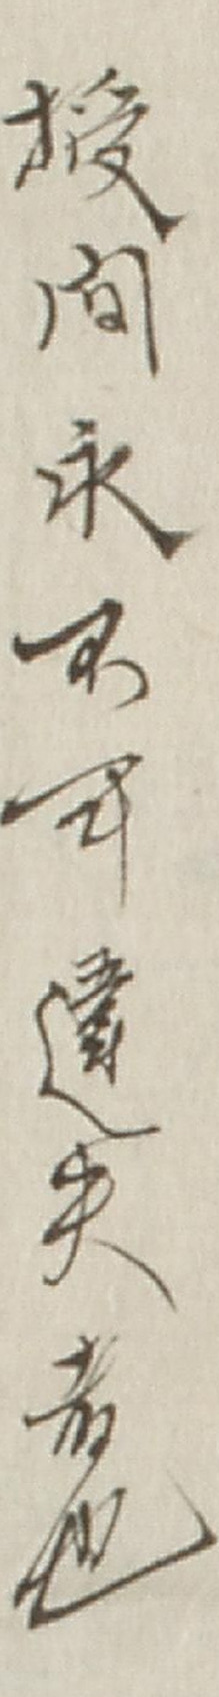御授間永不可遺失者也
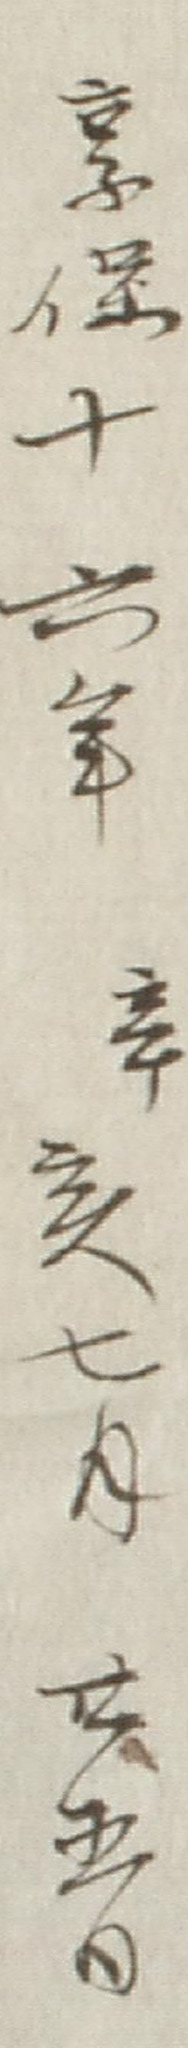享保十六年辛亥七月廿五日
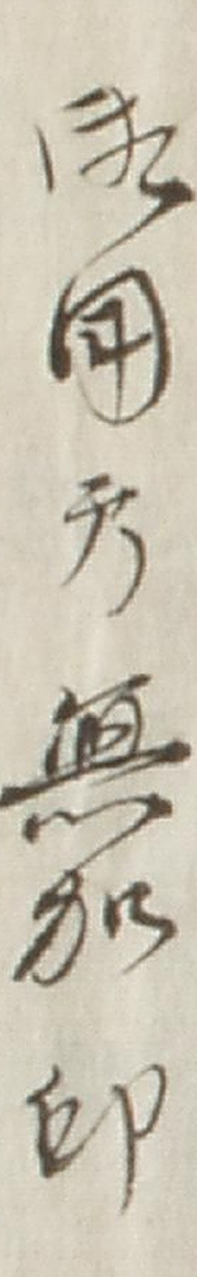御用方奥加印
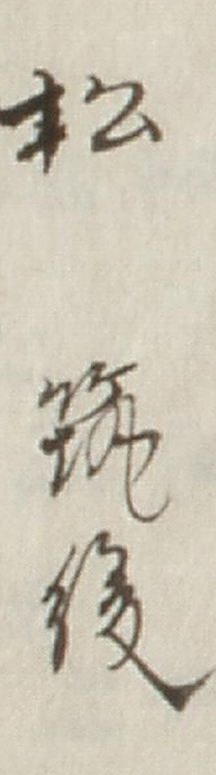松筑後
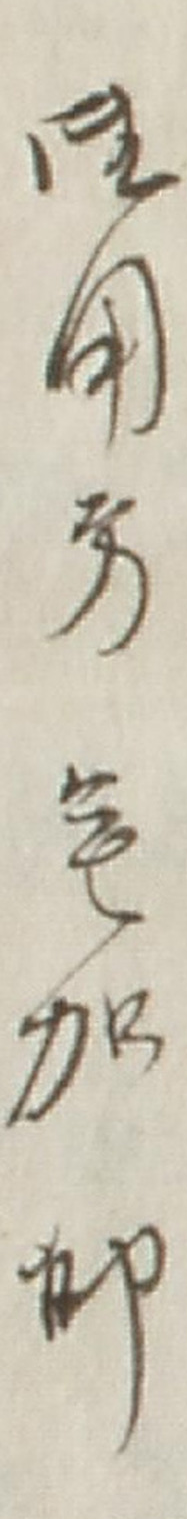御用方奥加印

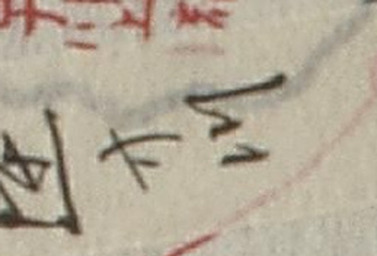逆サ川
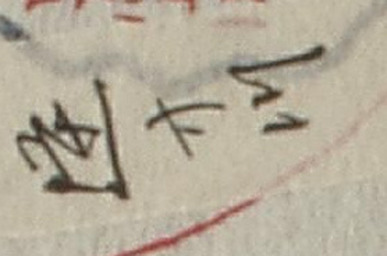逆サ川

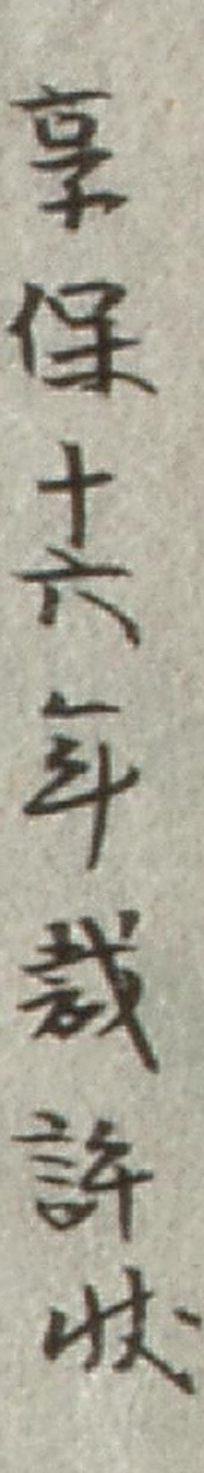享保十六年裁許状
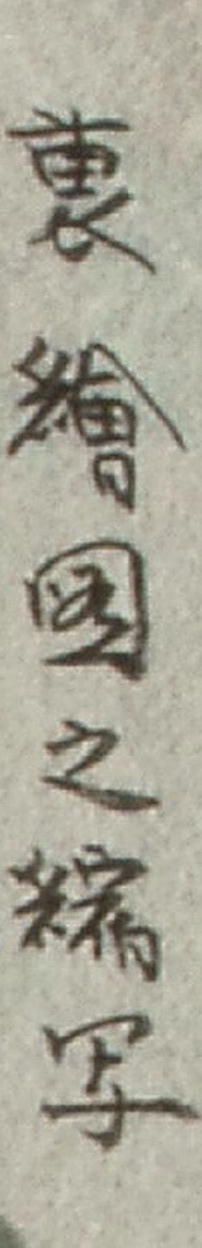裏絵図之縮写
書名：箱根湖水使用願　神奈川縣足柄下郡仙石原村外七ヶ町村
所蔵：東京大学地震研究所図書室 Earthquake Research Institute Library, The University of Tokyo, JAPAN
